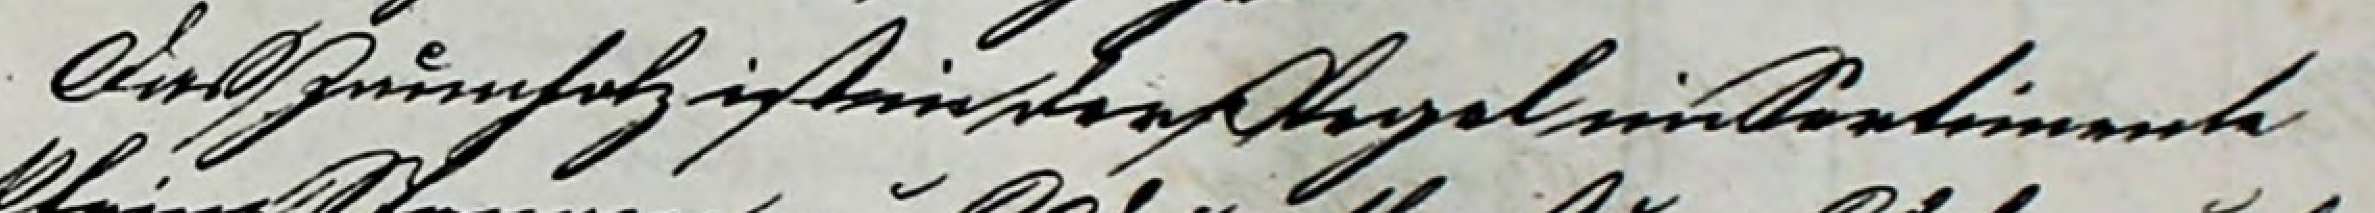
Das Zaunholz istein der Regel im Sortimente
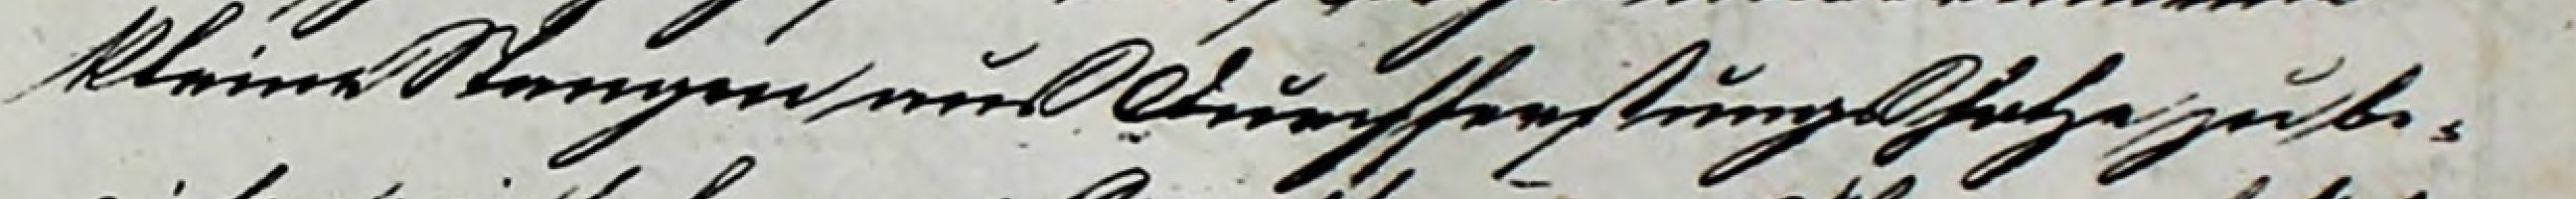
kleine Stangen aus Durchherstungsholze zube„
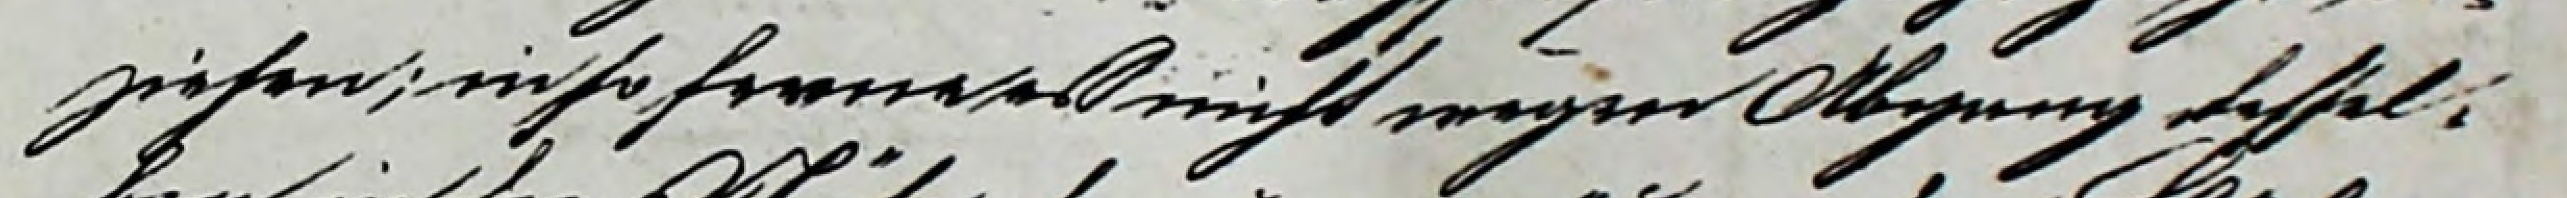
zinsen; in so Ferners nicht wegen Abgang dessel„
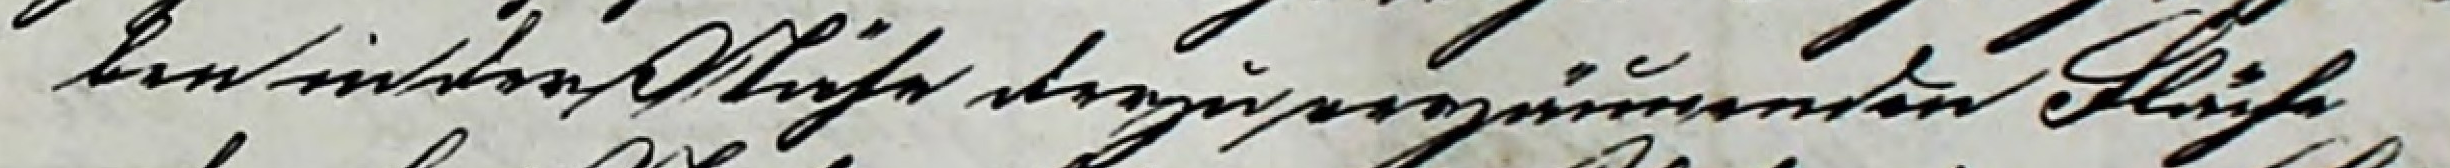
ben in der Nähe der zu verzäunenden Fläche
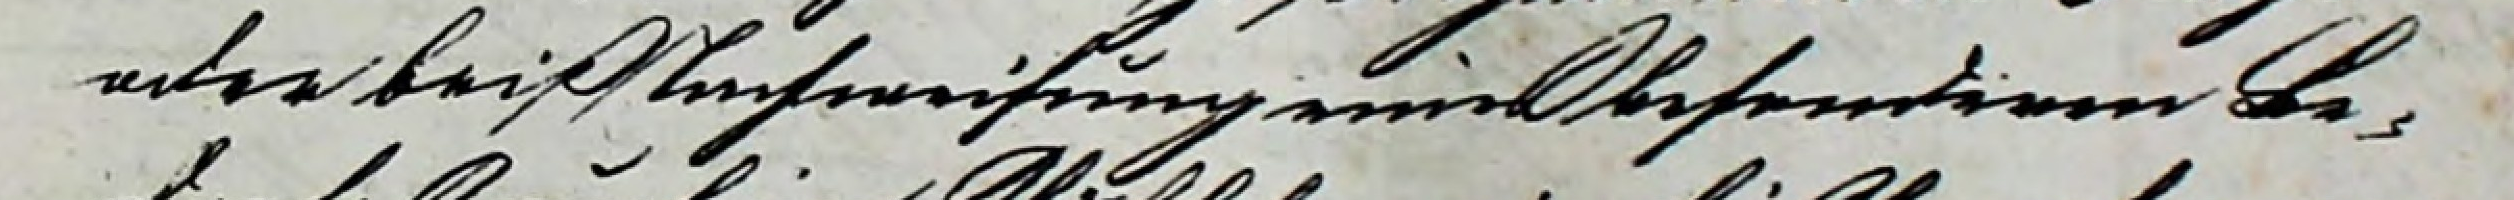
oder bei Nachweisung eines besenderen Be„
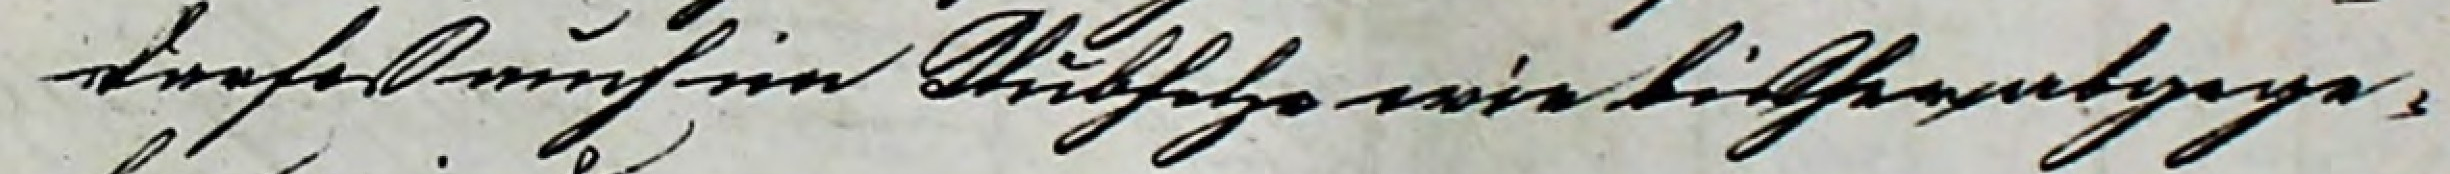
darfes auch im Klubholze wie bisher abgege„
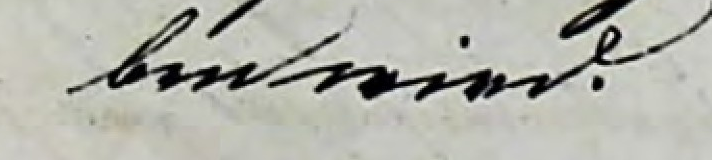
ben wird.
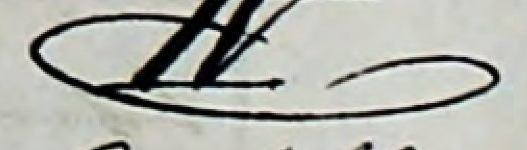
IV
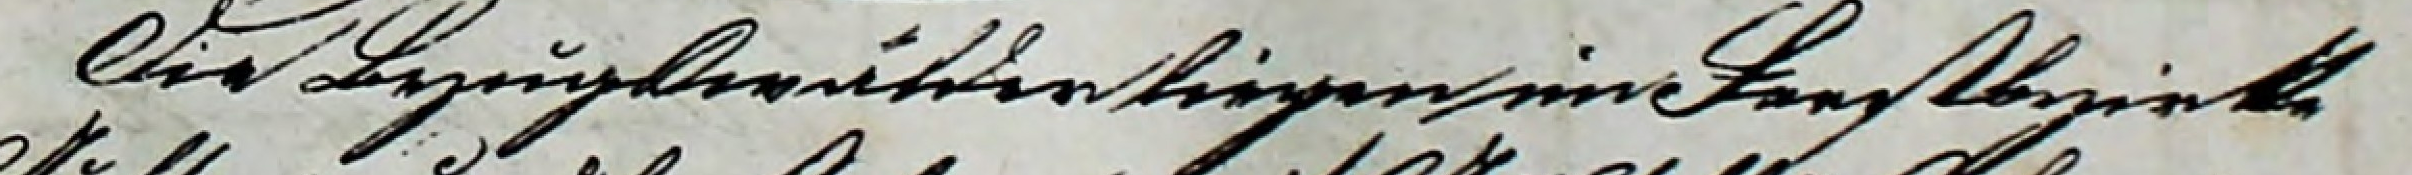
Die Bezeugswälder liegen im Forstbezirk
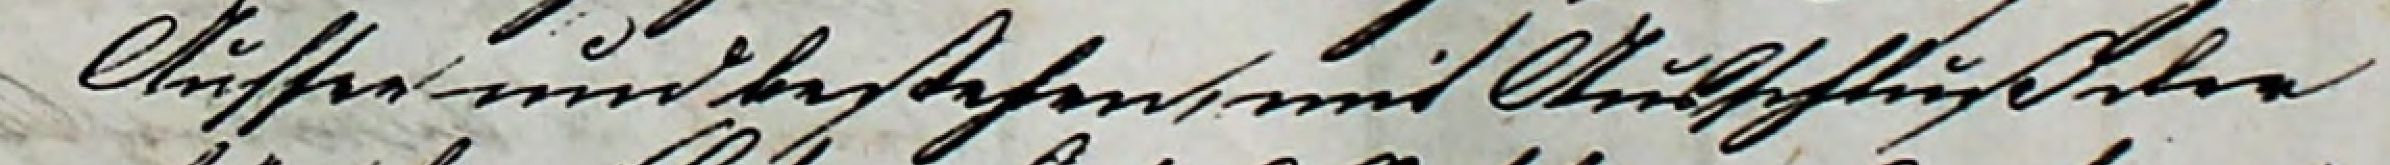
Aussee und bestehen, mit Ausschluß der
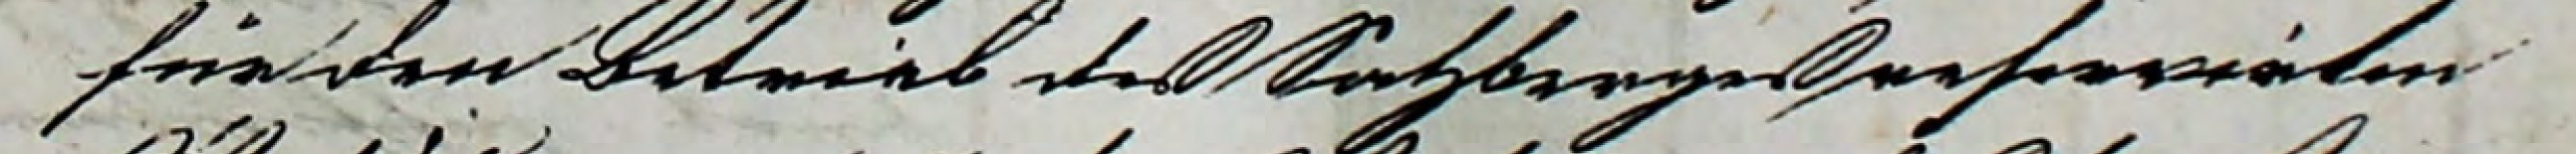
für den Betrieb des Salzberges veswewäten
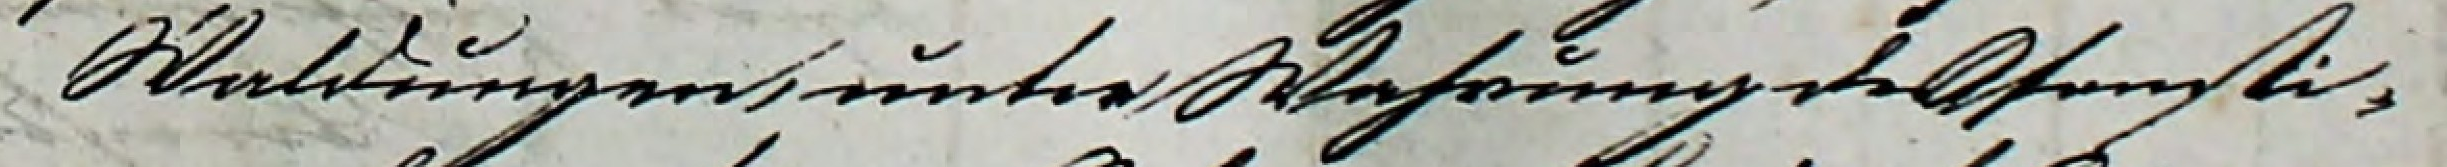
Waldungen, unter Wahrung des sonsti„
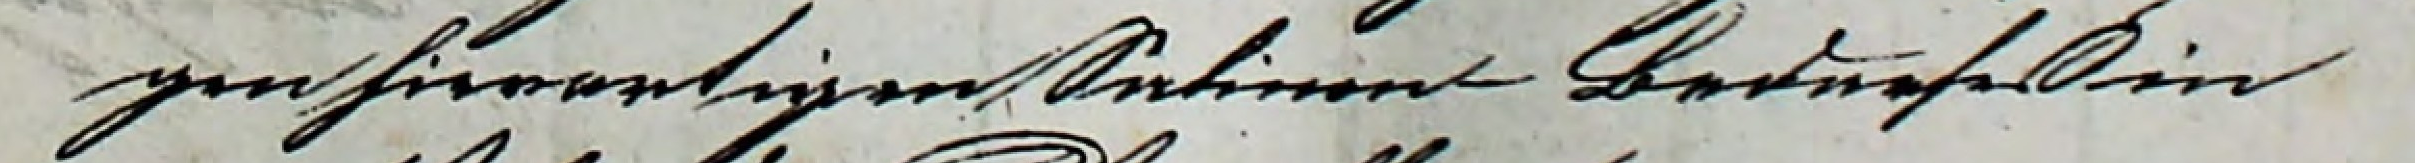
gen hierartigen Salinen Bedarfes in
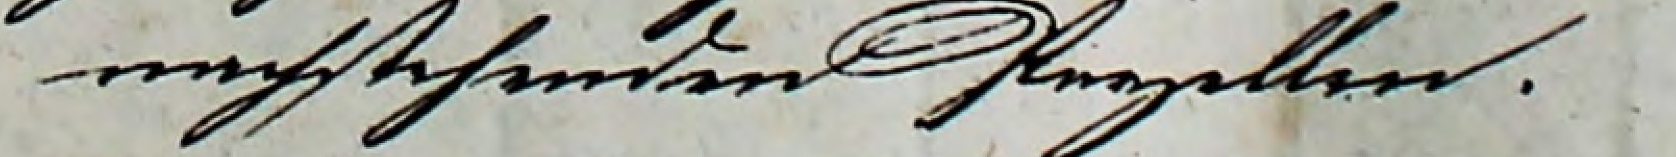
nachstehenden Parzellen.
